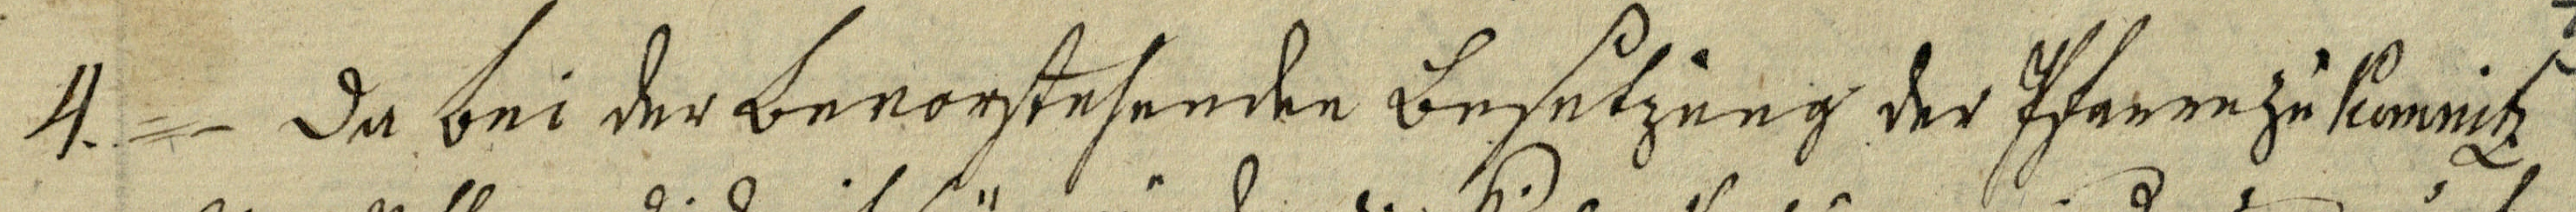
4. da bei der bevorstehenden Besetzung der Pfarre zu Kemnitz
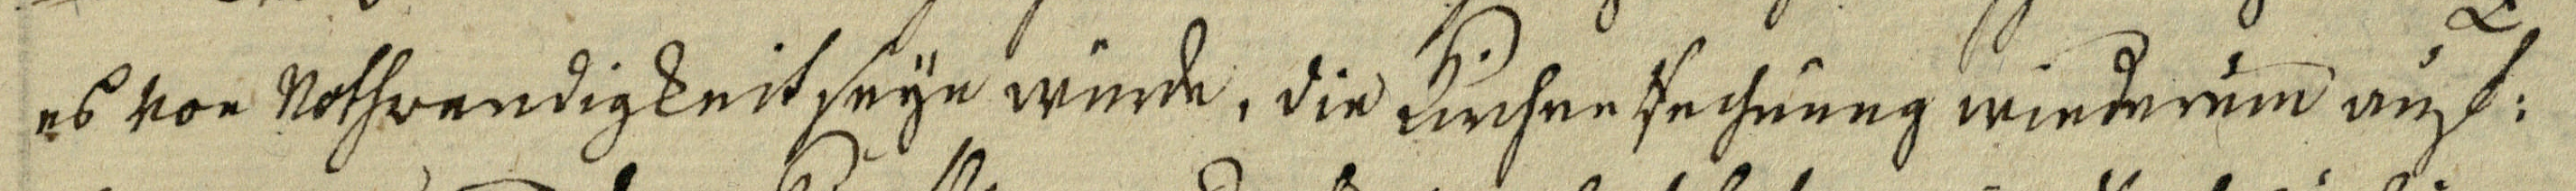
es von Nothwendigkeit seÿn würde, die Kirchen Rechnung wiederum auf¬
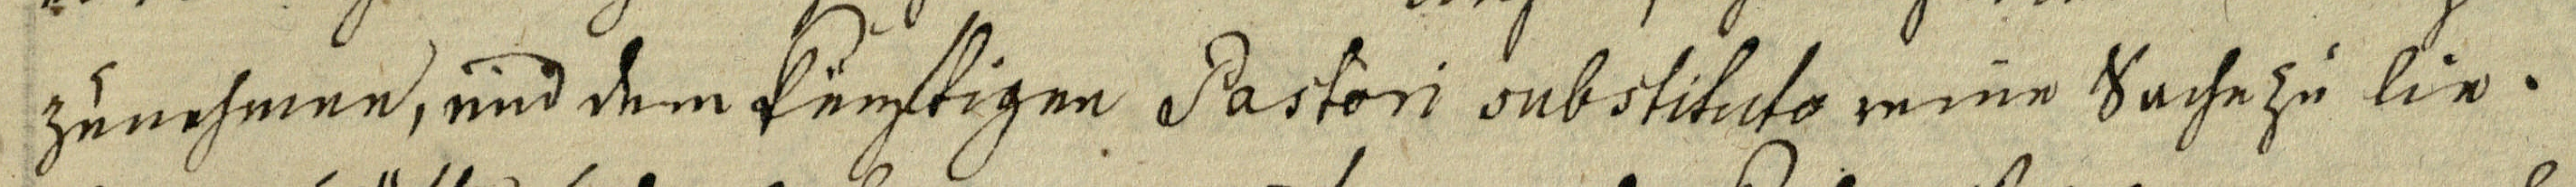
zunehmen, und dem künftigen Pastori substituto eine Sache zu lie¬
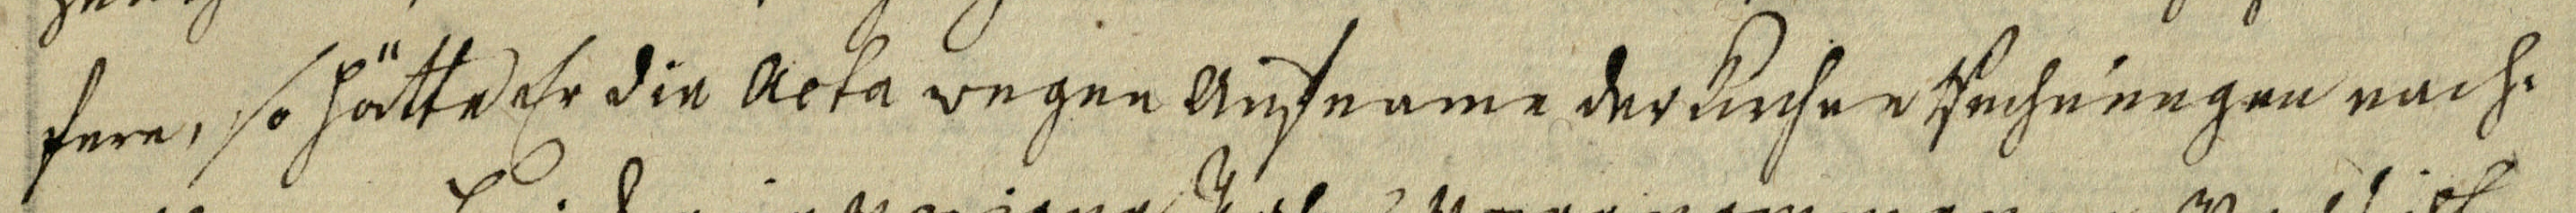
fern, so hätte Er die Acta wegen Aufname der Kirchen Rechnungen nach¬
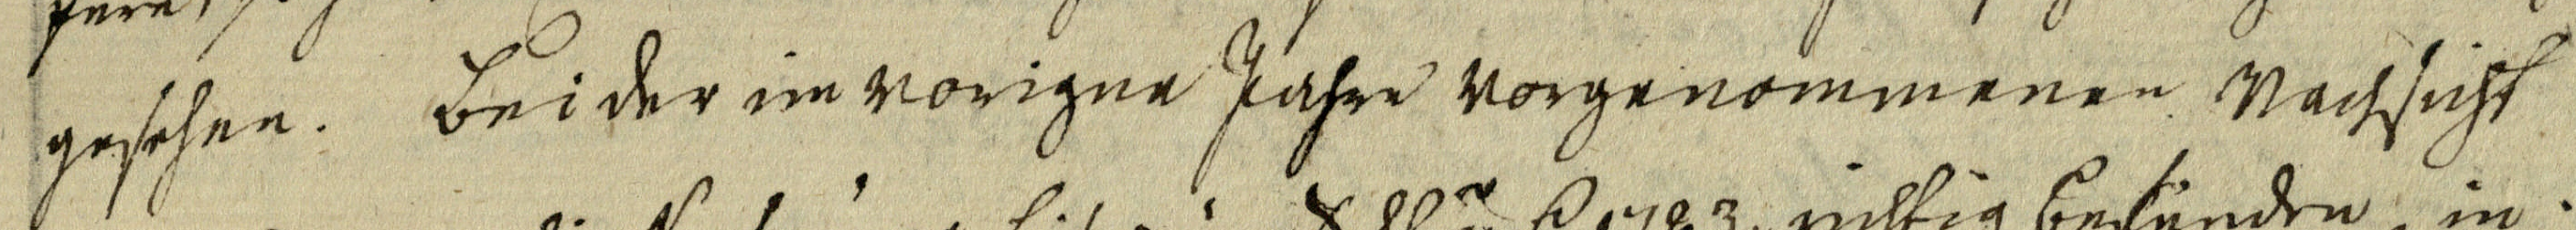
gesehen. Bei der im vorigen Jahre vorgenommenen Nachsicht
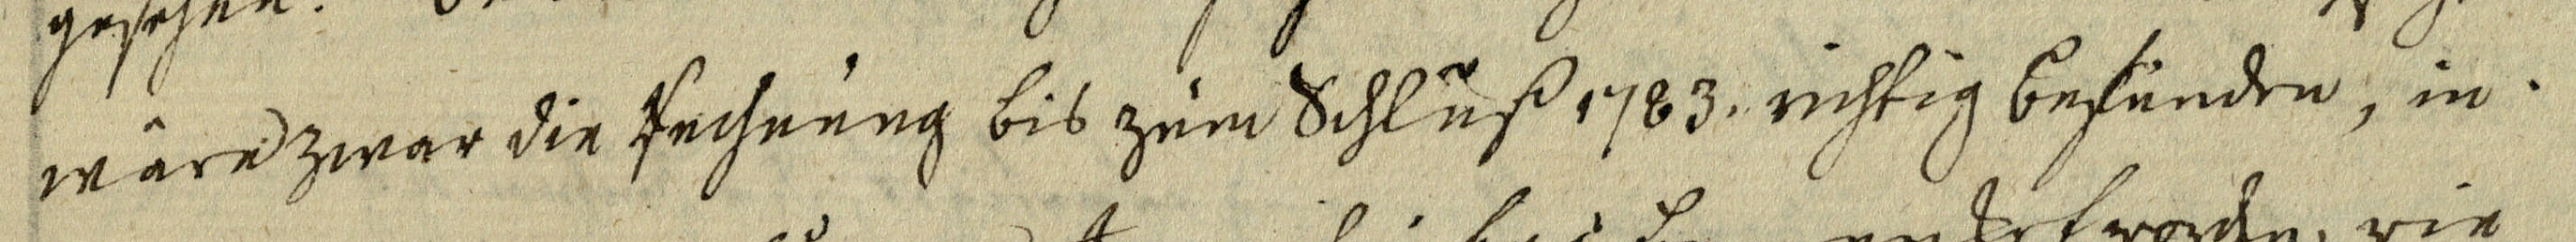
wäre zwar die Rechnung bis zum Schluß 1783. richtig befunden, in¬
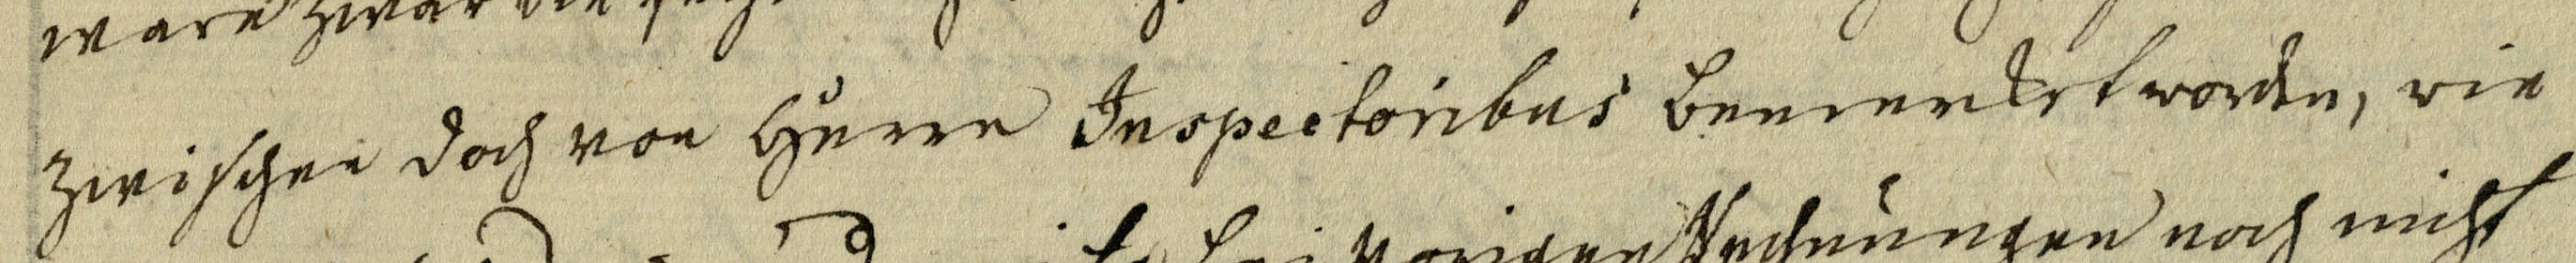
zwischen doch von Herrn Inspectoribus bemercket worden, wie
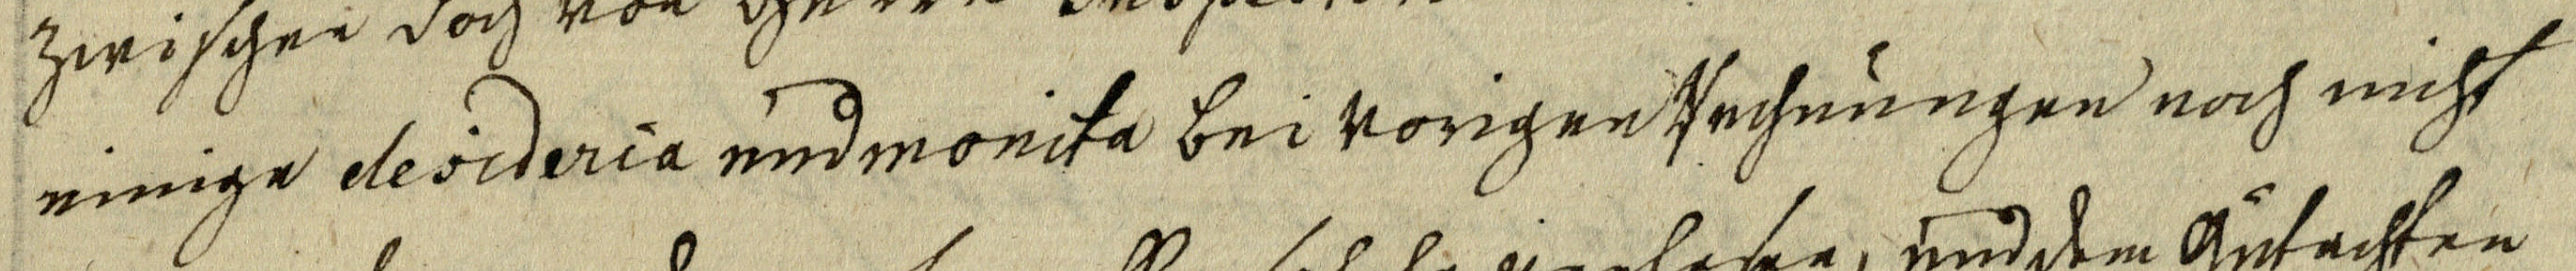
einige desideria und monita bei vorigen Rechnungen noch nicht
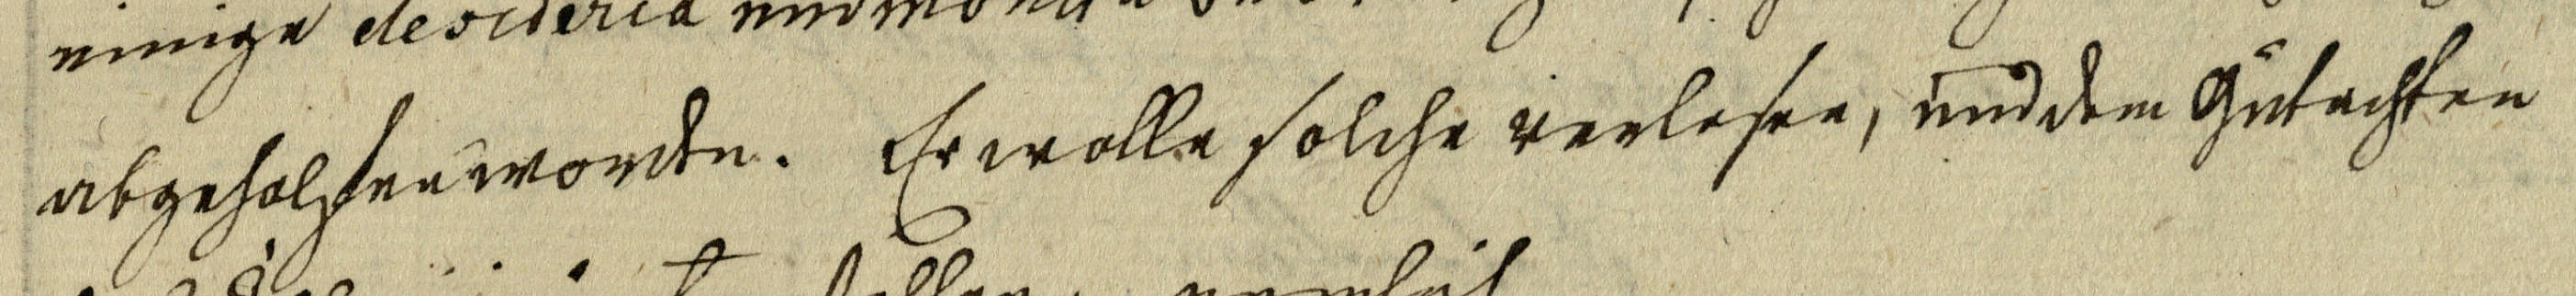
abgeholfen worden. Er wolle solche verlesen, und dem Gutachten
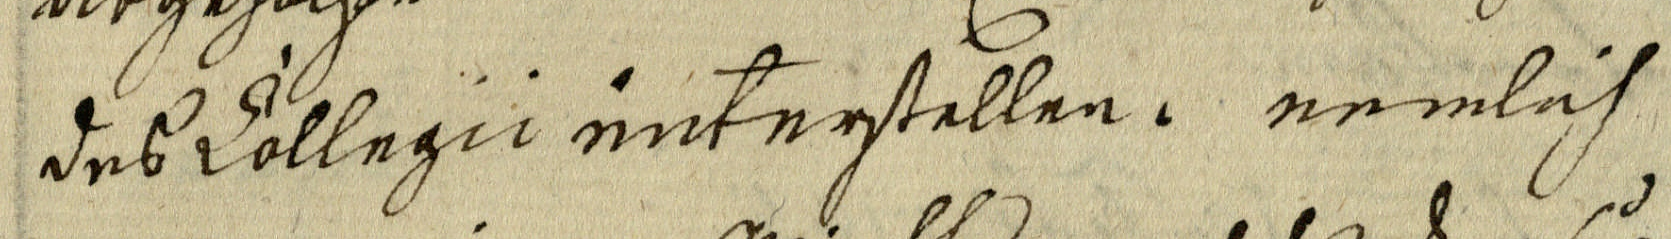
des Collegii unterstellen: nemlich
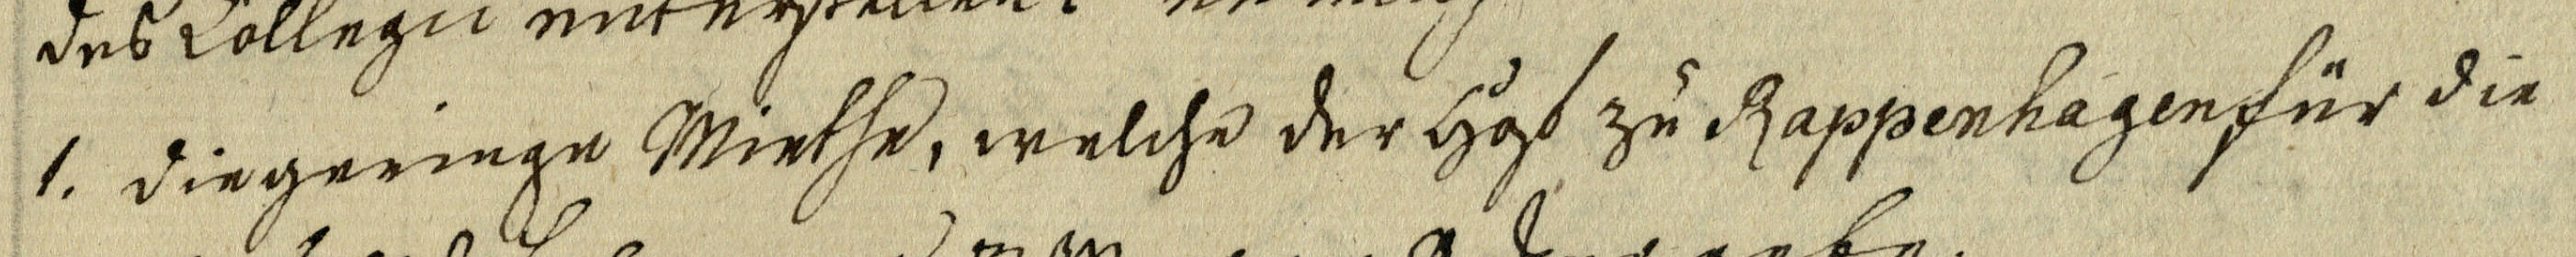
1. die geringe Miethe, welche der Hof zu Rappenhagen für die
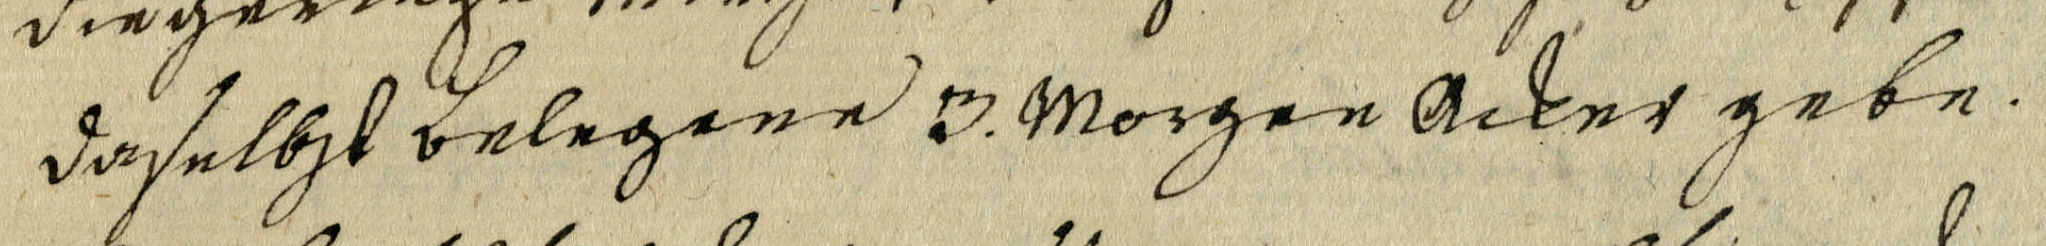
daselbst belegene3. Morgen Acker gebe.
